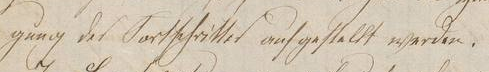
gung des Fortschrittes aufgestellt werden.
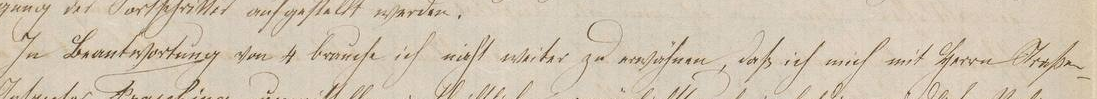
In Beantwortung von 4 brauche ich nicht weiter zu erwähnen, daß ich mich mit Herrn Straßen-
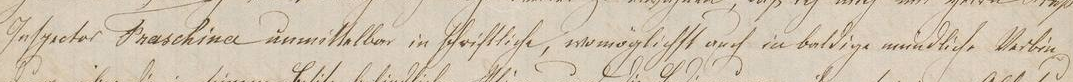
Inspector Fraschina unmittelbar in schriftliche, womöglichst auch in baldige mündliche Verbin-
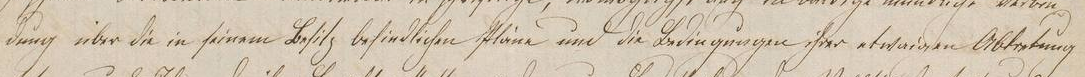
dung über die in seinem Besitz befindlichen Pläne und die Bedingungen ihrer etwaigen Abtretung
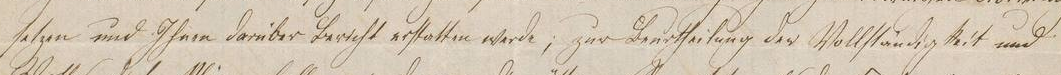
setzen und Ihnen darüber Bericht erstatten werde; zur Beurtheilung der Vollständigkeit und
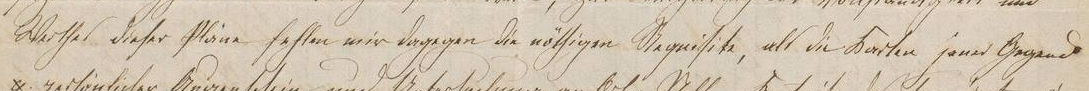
Werthes dieser Pläne fehlen mir dagegen die nöthigen Requisite, als die Karten jener Gegend
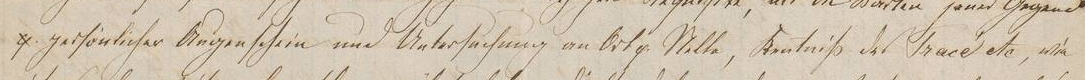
& persönlicher Augenschein und Untersuchung an Ort & Stelle, Kenntniß der Tracé etc, wie
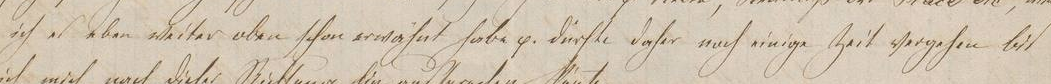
ich es eben weiter oben schon erwähnt habe & dürfte daher noch einige Zeit vergehen bis
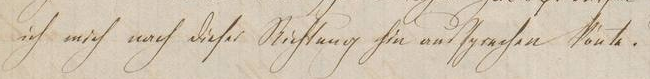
ich mich nach dieser Richtung hin aussprechen könnte.
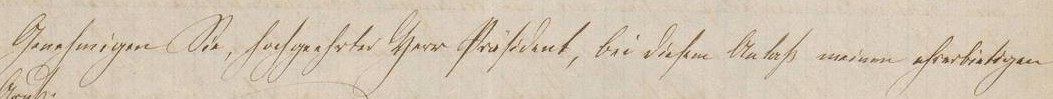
Genehmigen Sie, Hochgeehrter Herr Präsident, bei diesem Anlaß meinen ehrerbietigen
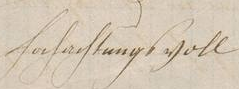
Hochachtungsvoll
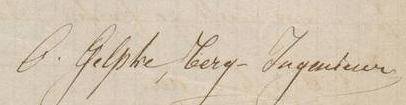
O. Gelpke, Berg-Ingenieur
